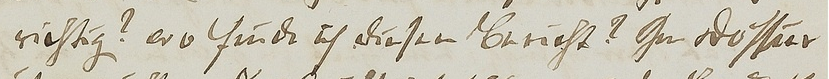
richtig? wo finde ich diesen Bericht? Im Dossier
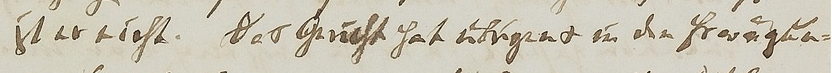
ist er nicht. Das Gericht hat übrigens in den Erwägun-
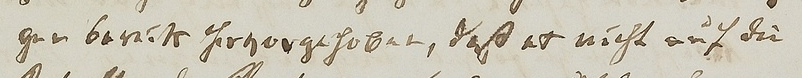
gen bereits hervorgehoben, daß es nicht auf die
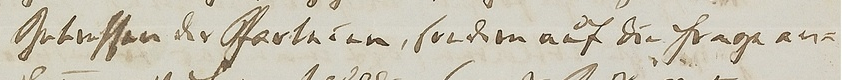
Intressen der Parteien, sondern auf die Frage an-
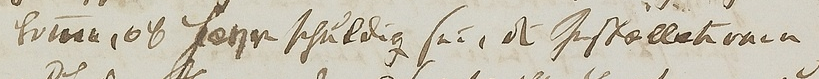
komme, ob Favre schuldig sei, die Installationen
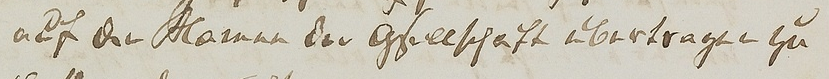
auf den Namen der Gesellschaft übertragen zu
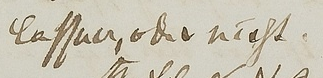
lassen, oder nicht.
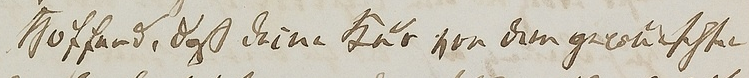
Hoffend, daß Deine Kur von dem gewünschten
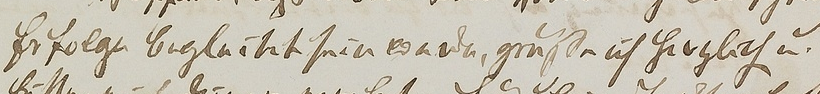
Erfolge begleitet sein werde, grüsse ich herzlich u.
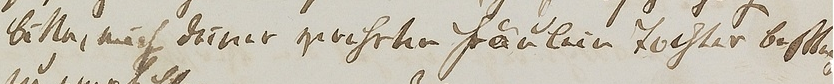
bitte, mich Deiner verehrten Fräulein Tochter bestens
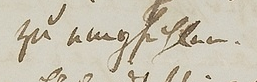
zu empfehlen.
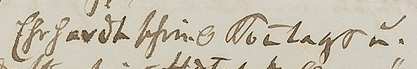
Ehrhardt schrieb Sonntags u.
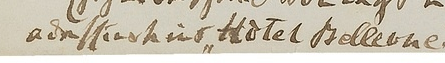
adressierte ins «Hôtel Bellevue».
